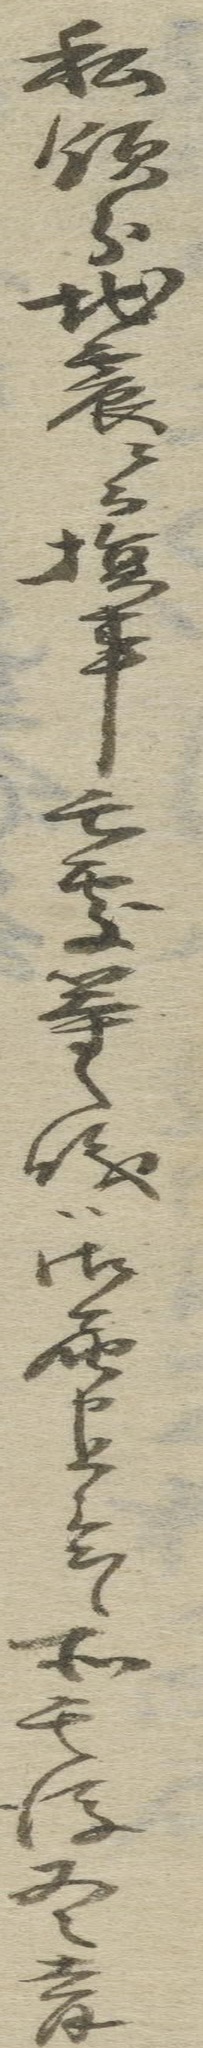私領分地震二而損事亡処等之儀ハ御届申上置候所其後又々去月
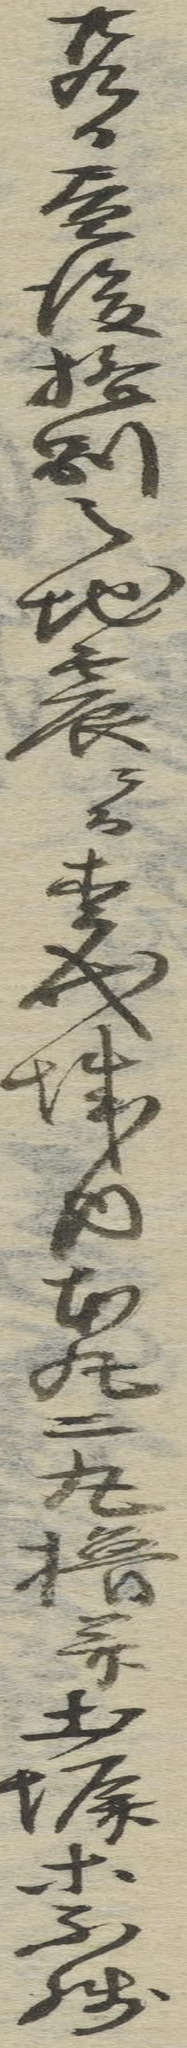廿九日昼夜格別之地震二而枩代城内本丸二丸櫓并土塀等不残
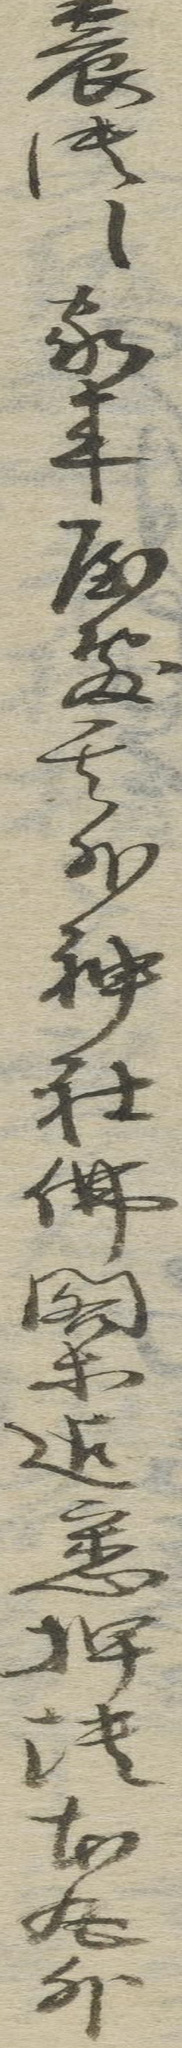震潰し家来屋敷其外神社仏閣等迄悉押潰本丸外
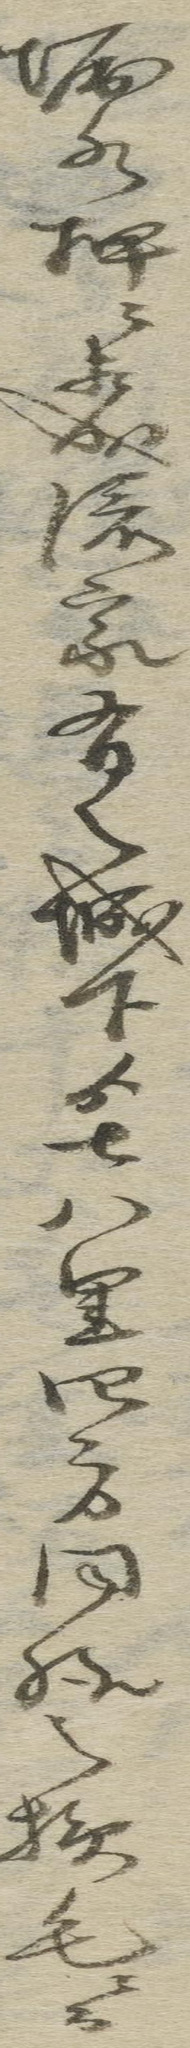堀水押二相成流家有之城下ゟ七八里四方同様之損毛二而
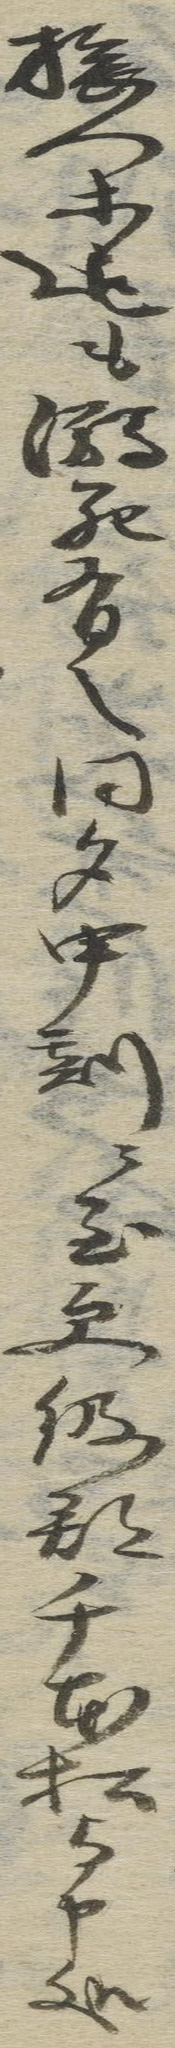旅人等迄も溺死有之同夕申刻二至更級郡千本松と申処
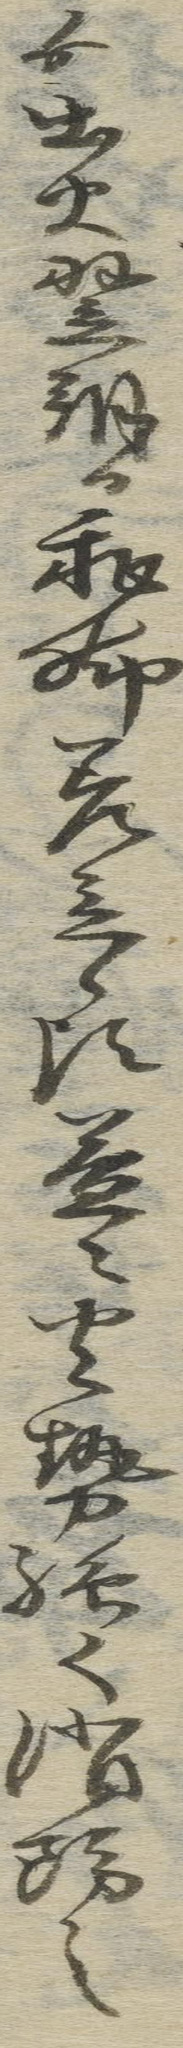ゟ出火翌朔日飛脚差立候頃益々火勢強く消防之
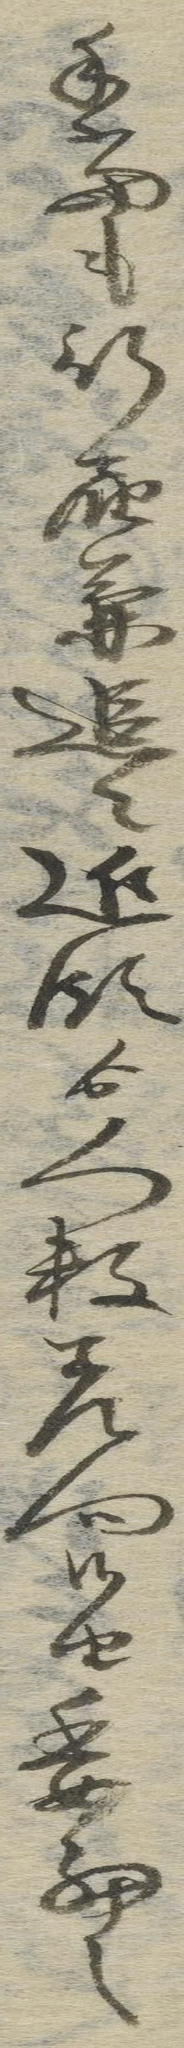手当も行届兼追々近領ゟ人数差向候由委細之
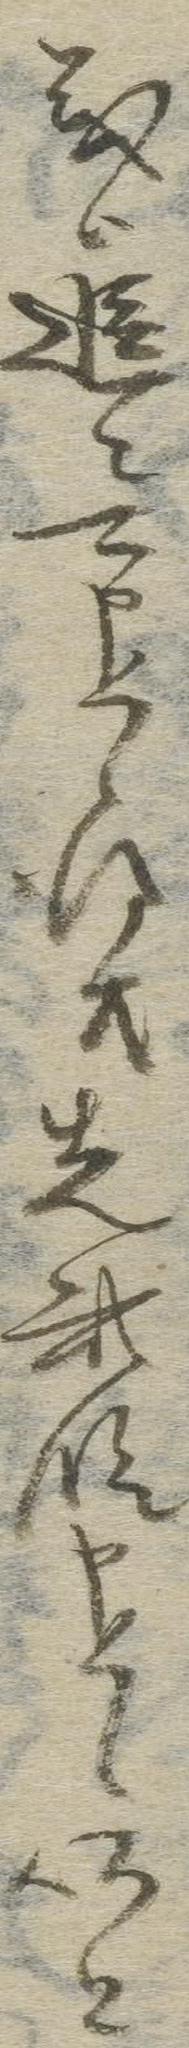義ハ追々可申上候得共先此段申上候以上
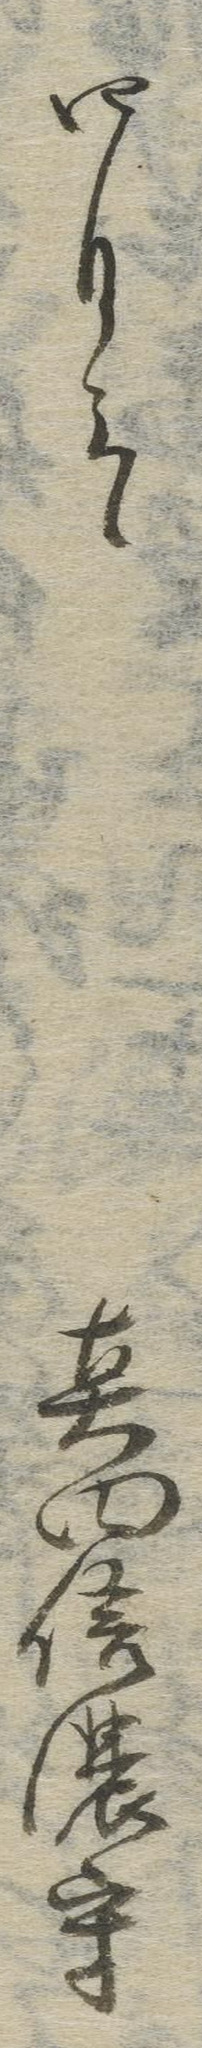四月三日真田信濃守
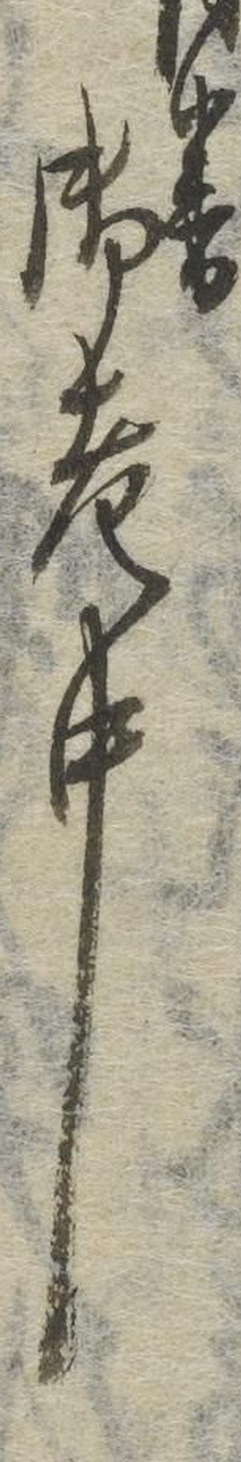御老中
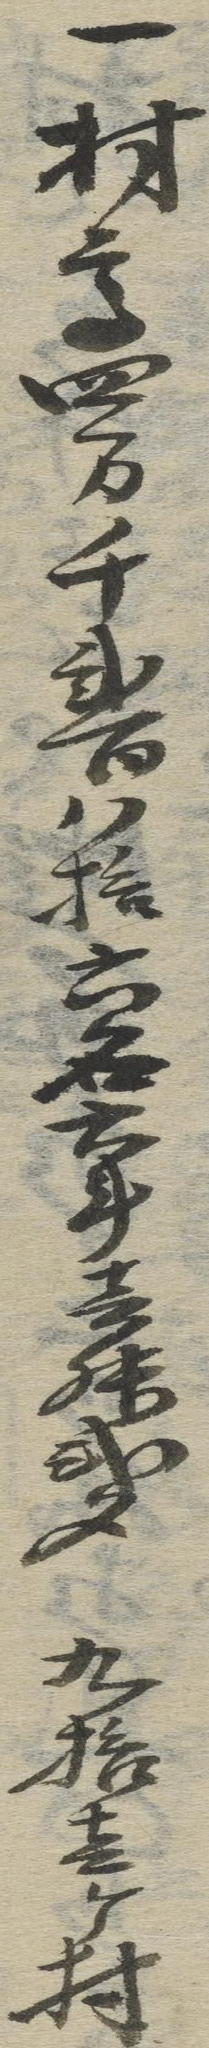一村高四万千弐百八拾六石六斗壱升弐夕九拾壱ヶ村
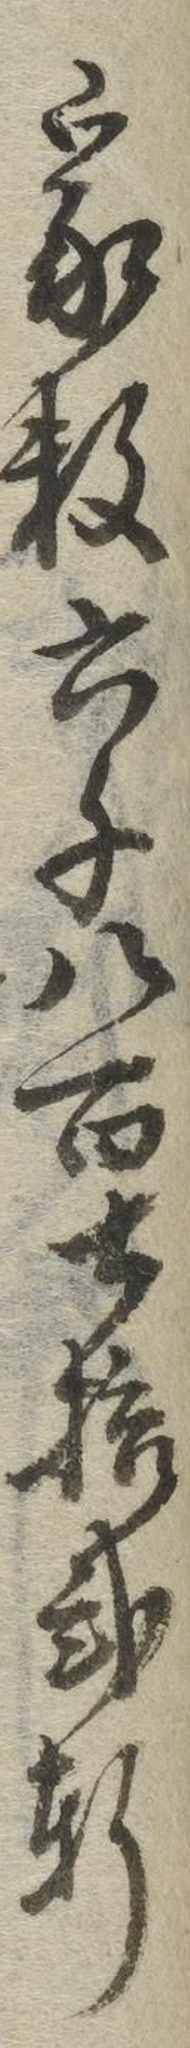家数六千八百六拾弐軒
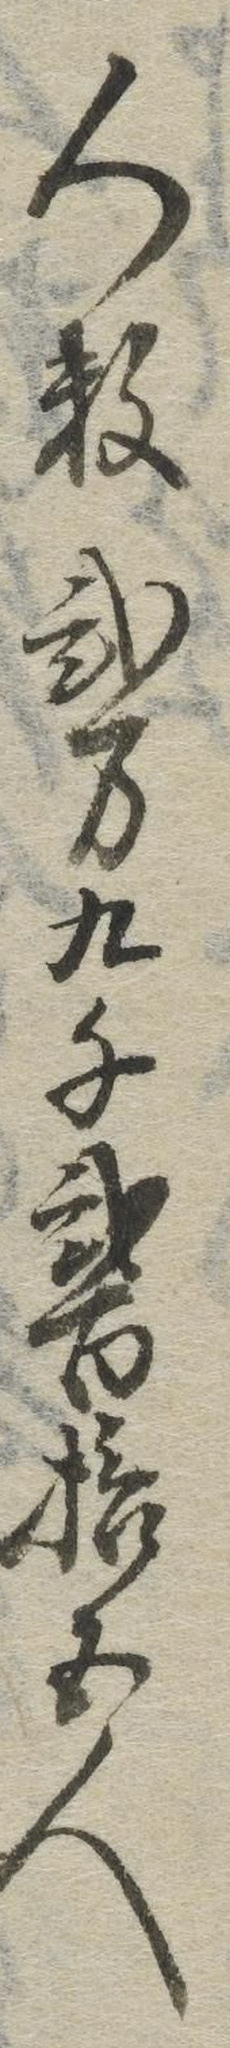人数弐万九千弐百拾五人
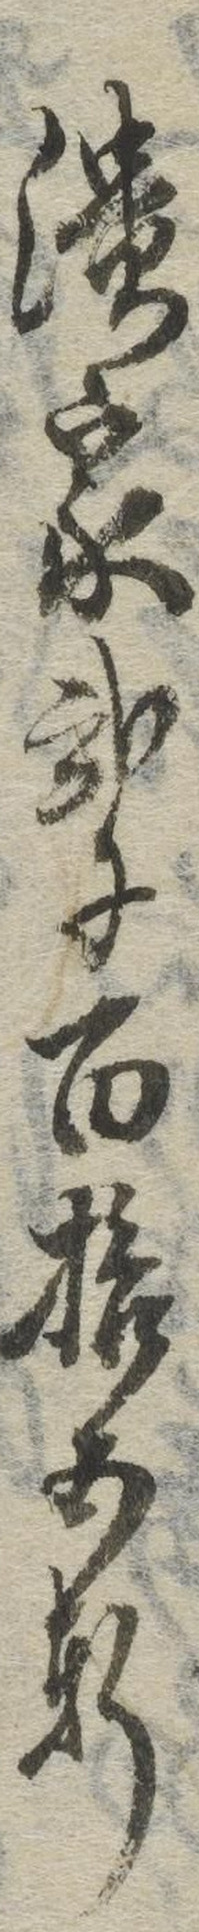潰家弐千百拾五軒
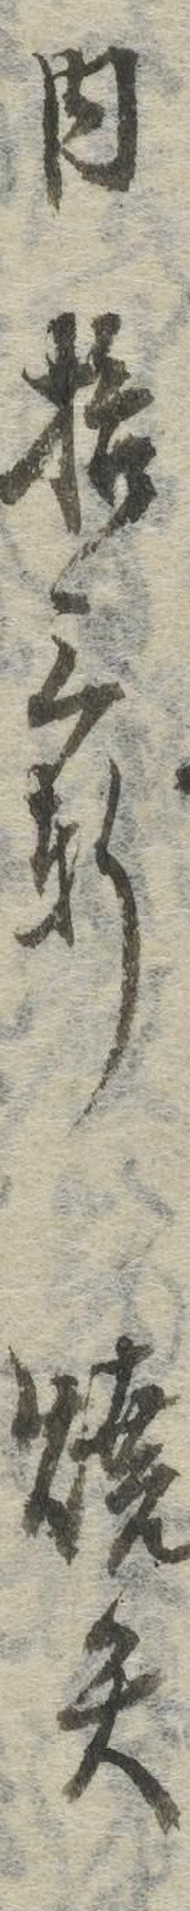内拾三軒焼失
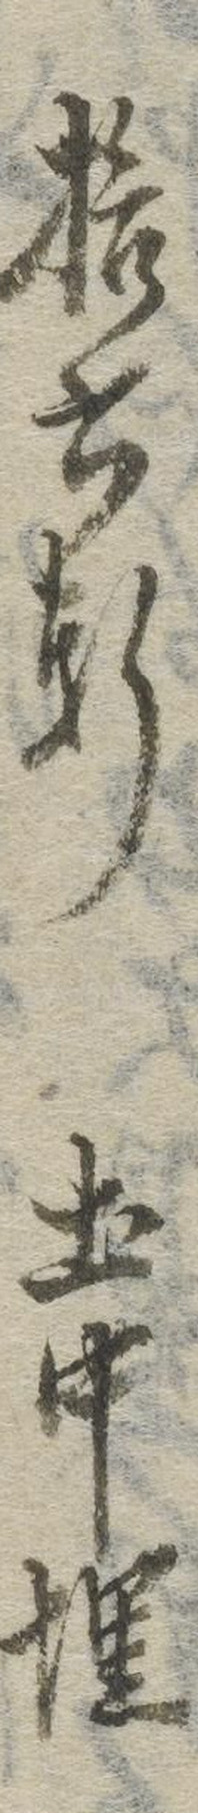拾六軒土中埋
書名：信濃越後　地震書留
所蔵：東京大学地震研究所図書室 Earthquake Research Institute Library, The University of Tokyo, JAPAN
